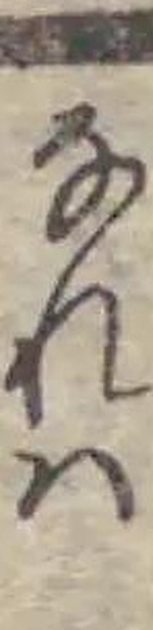なれば
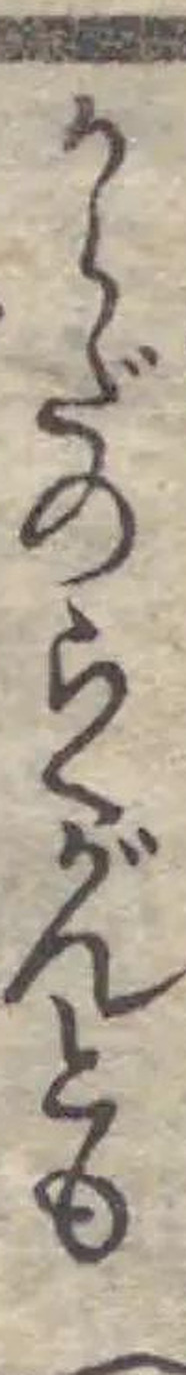からだのらくがんとも
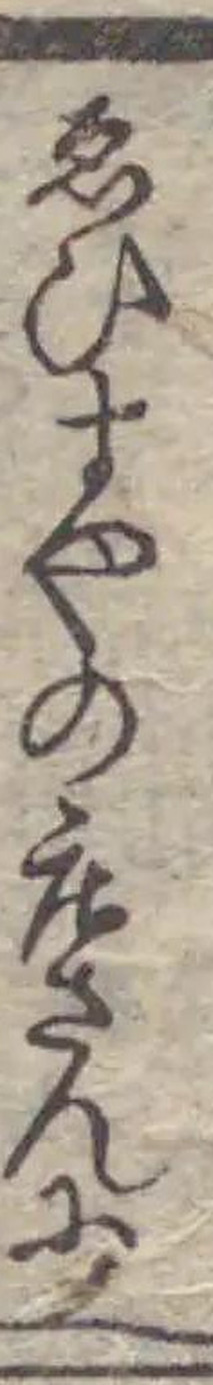ゑひすやの庄さんに
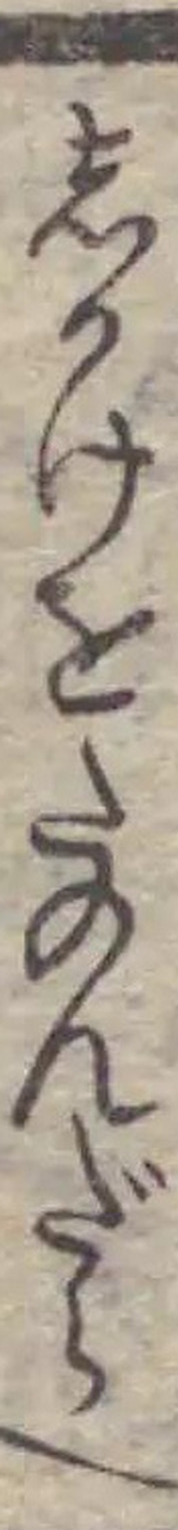しかけをたのんだら
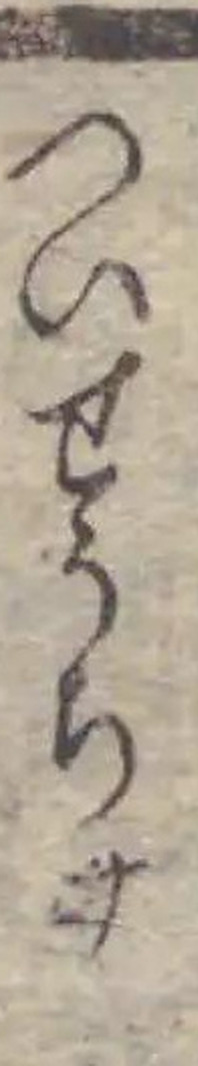ついせうちす
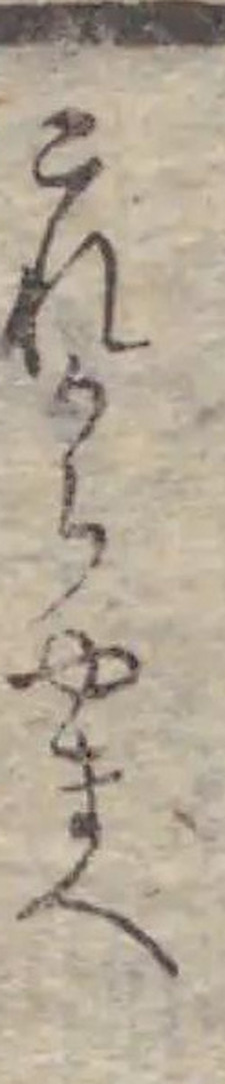これからやまへ
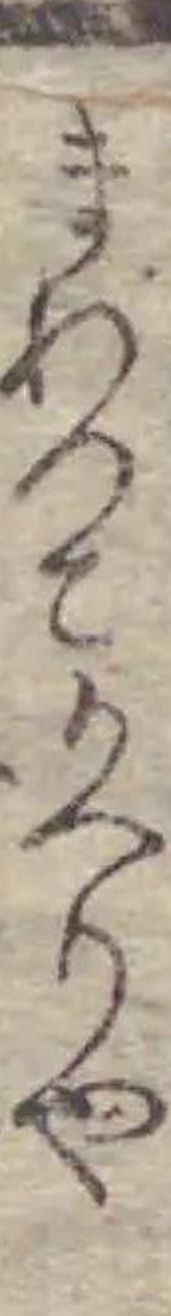まわつてかへりや

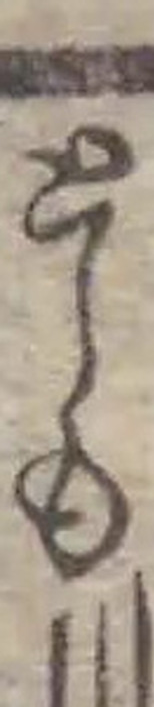としも
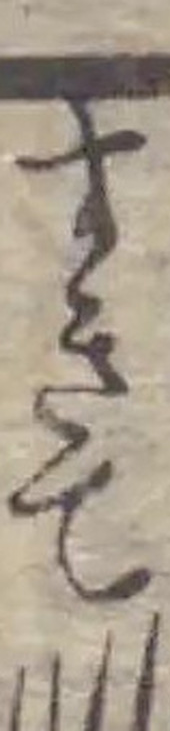すきて
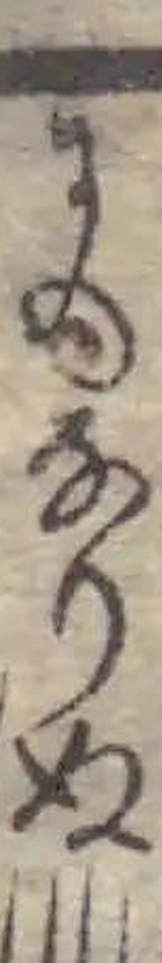にもなりぬ
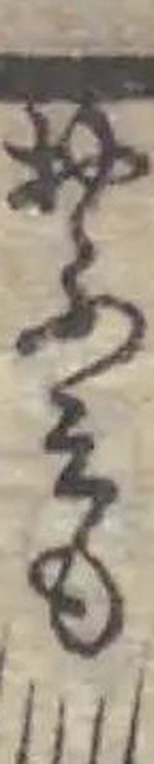おふみも
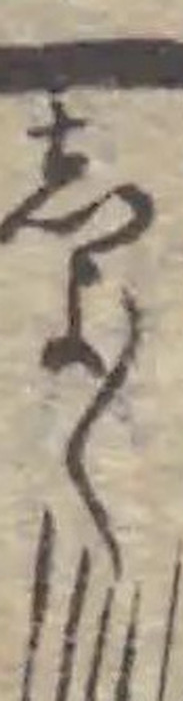しよ〳〵
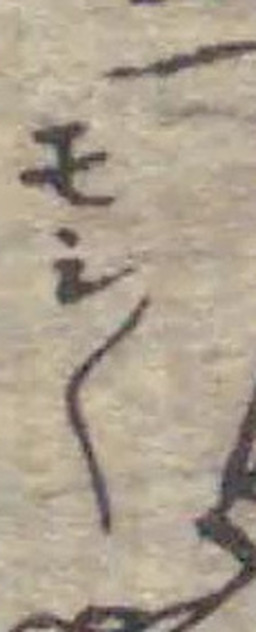モシ〳〵
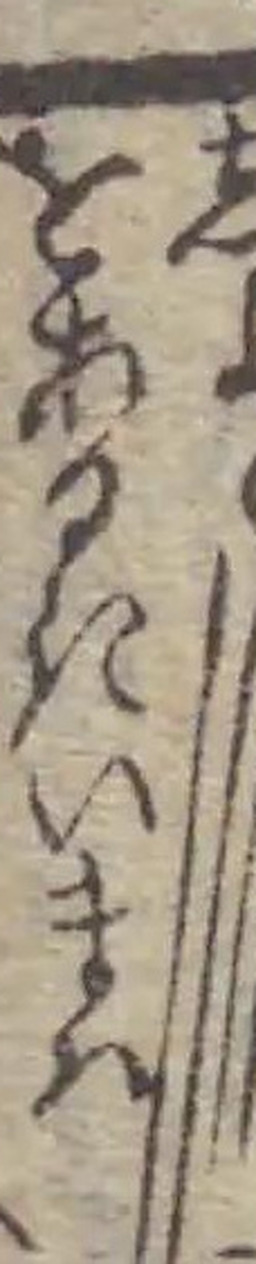をあるきいまは
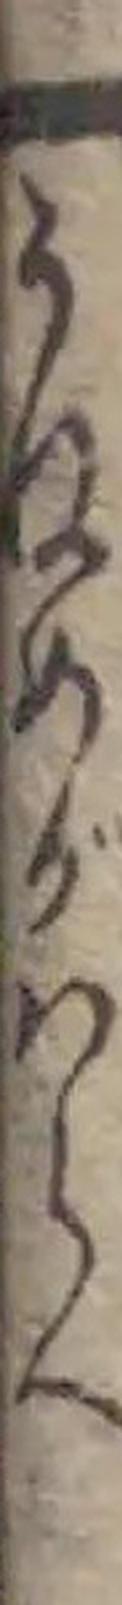うねめがはらへ
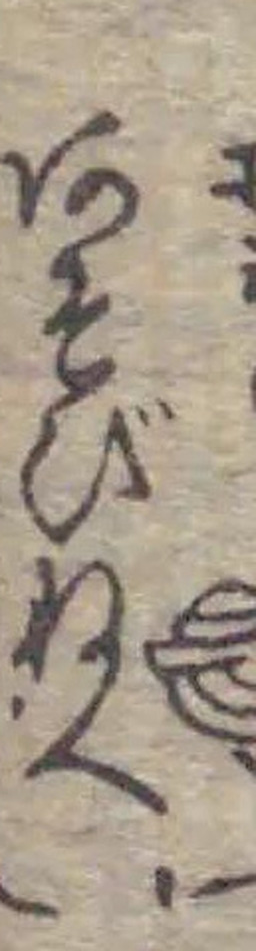あそびねへ
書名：かんなんの夢枕 2巻
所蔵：国立国会図書館 National Diet Library, JAPAN
